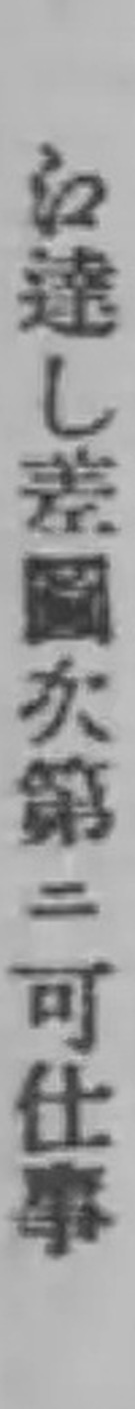え達し差図次第ニ可仕事

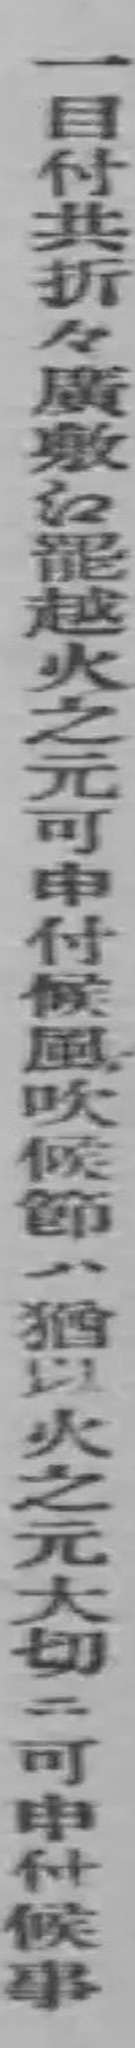一目付共折々広敷え罷越被火之元可申付候風吹候節は猶以火之元大切ニ可申付候事
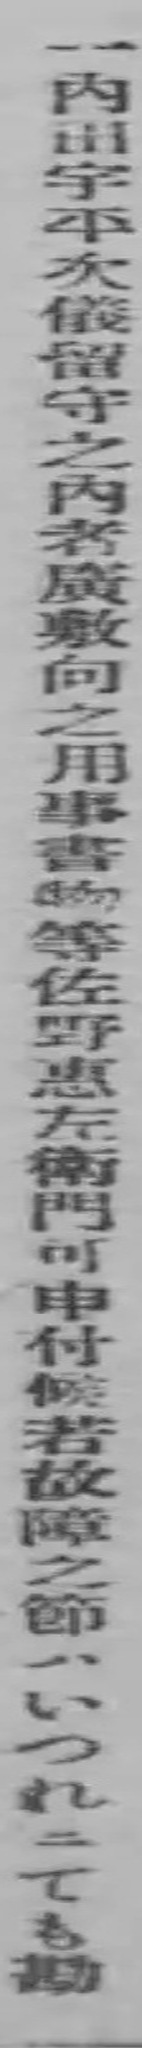一内田宇平次儀留主之内者広敷向之用事書物等佐野恵左衛門可申付候若故障之節はいつれニても勘
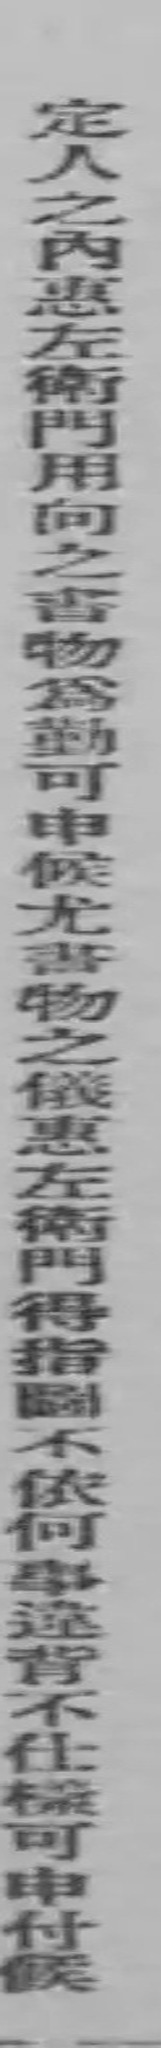定人之内恵左衛門用向之書物為勤可申候尤書物之儀恵左衛門得指図不依何事違背不仕様可申付候
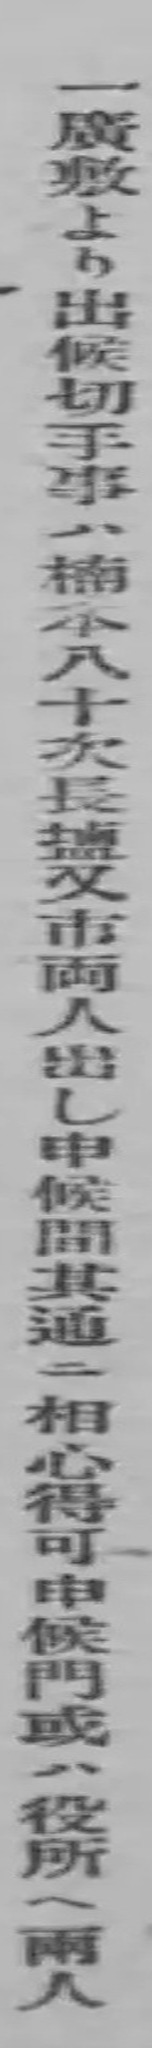一広敷より出候切手事は楠本八十次長塩又市両人出し申候間其通ニ相心得可申候門或は役所へ両人
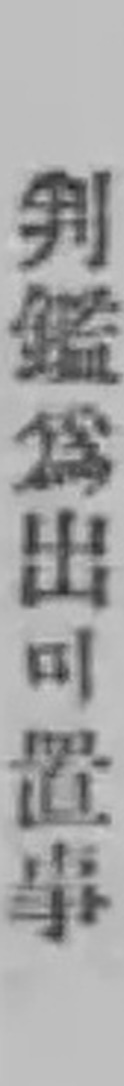判鑑為出可置事
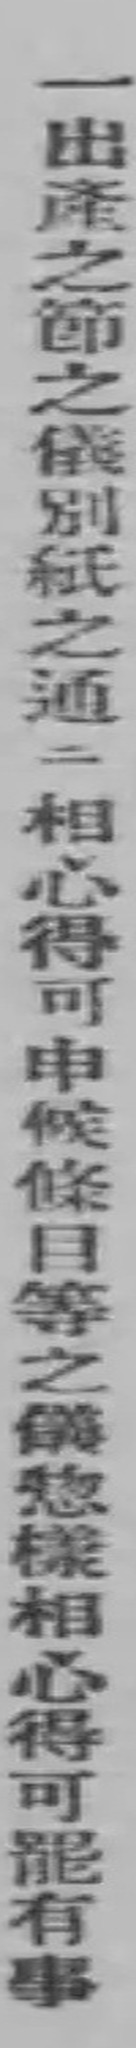一出産之節之儀別紙之通ニ相心得可申候條目等之儀惣様相心得可罷有事
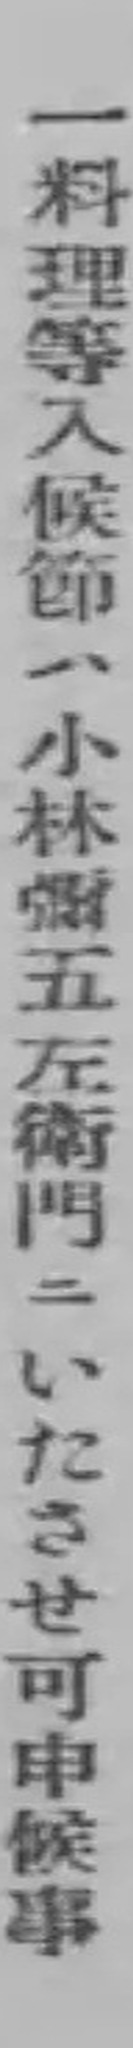一料理等入候節は小林弥五左衛門ニいたさせ可申候事
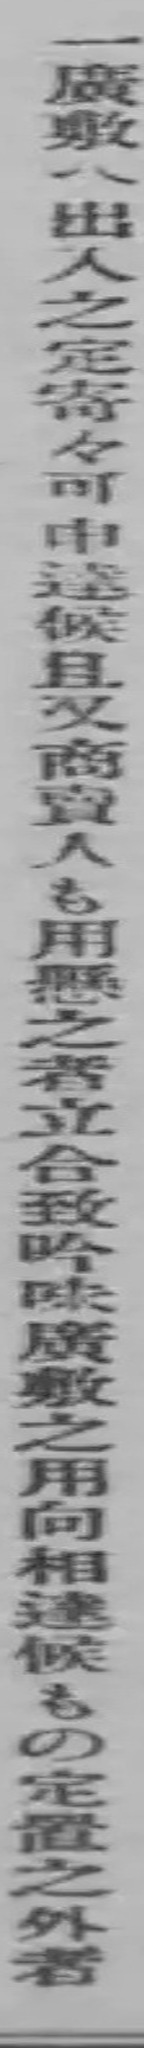一広敷へ出入之定寄々可申達候且又商売人も用懸之者立合致吟味広敷之用向相達候もの定置之外者
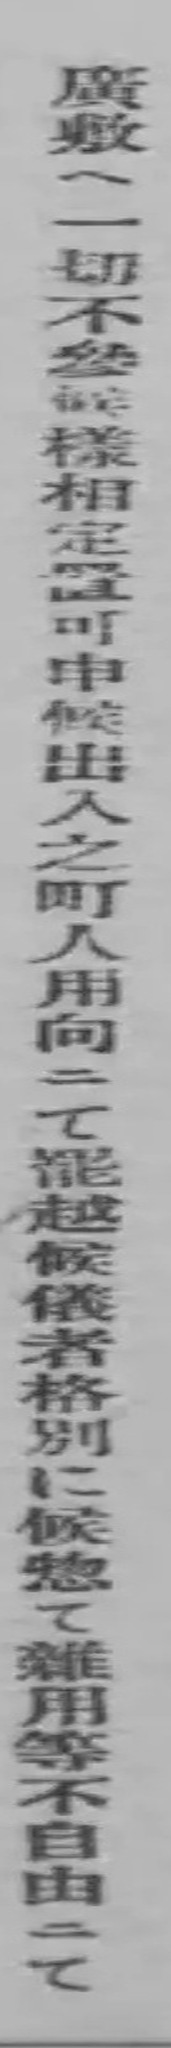広敷へ一切不参候様相定置可申候出入之町人用向ニて罷越候儀者格別に候惣て雑用等不自由ニて
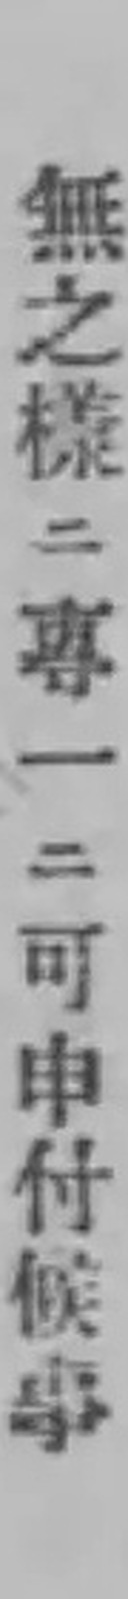無之様ニ専一ニ可申付候事
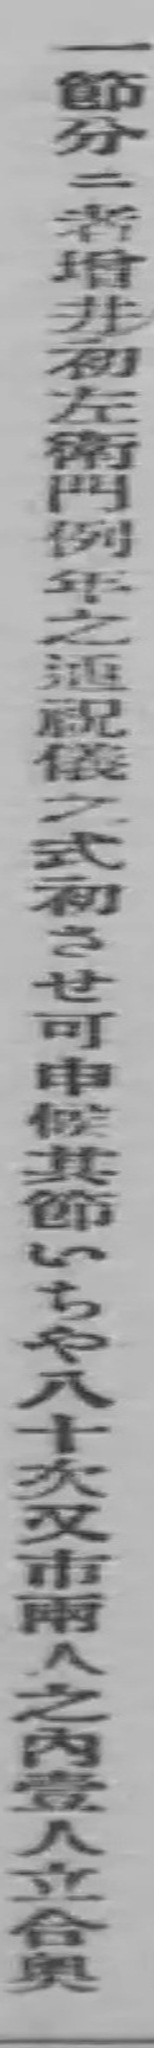一節分ニ者増井初左衛門例年之通祝儀之式初させ可申候其節いちや八十次又市両人之内壱人立合奥
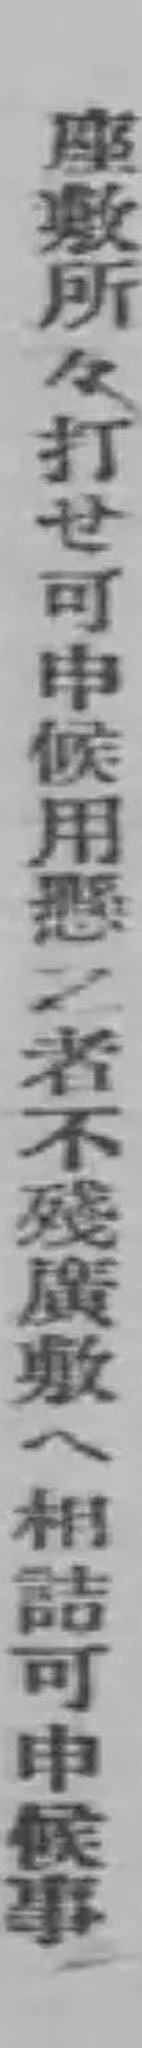座敷所々打せ可申候用懸之者不残広敷へ相詰可申候事
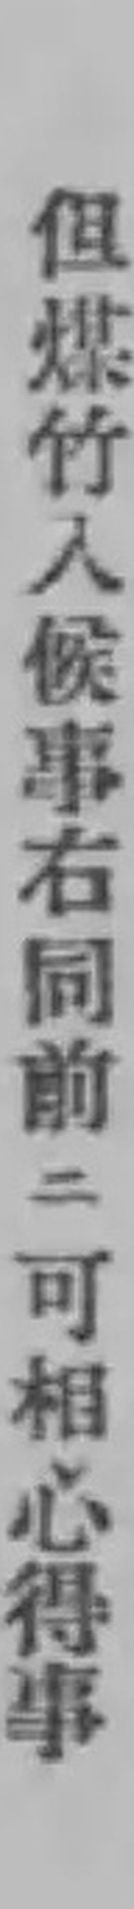但煤竹入候事右同前ニ可相心得事
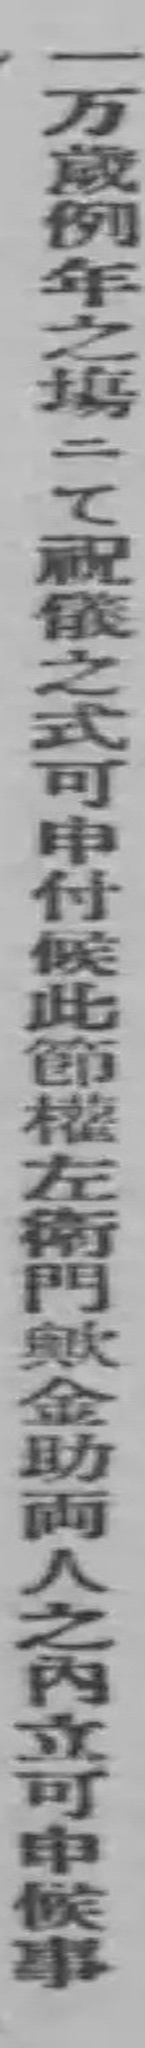一万歳例年之場ニて祝儀之式可申付候此節権左衛門歟金助両人之内立可申候事
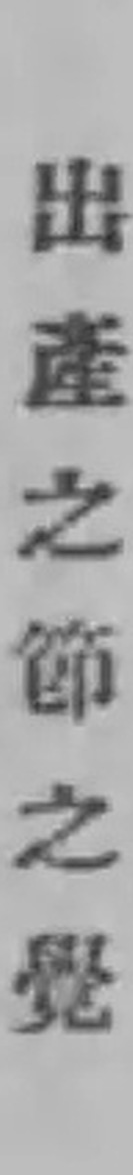出産之節之覚
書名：豊橋市史談
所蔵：国立国会図書館 National Diet Library, JAPAN
